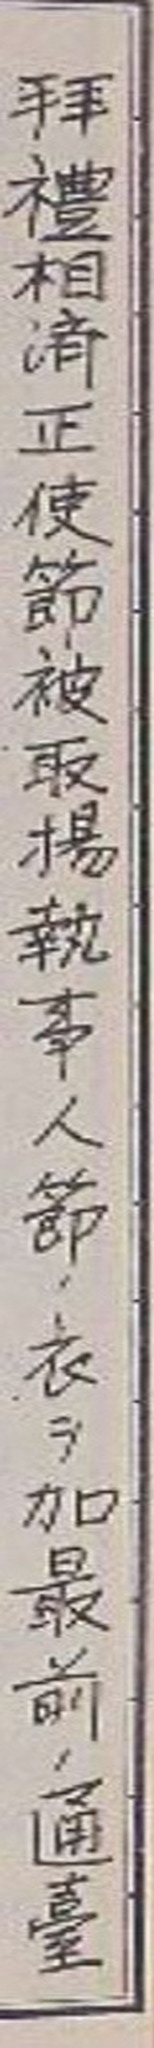拝礼相済正使節被取揚執事人節の衣を加最前の通台
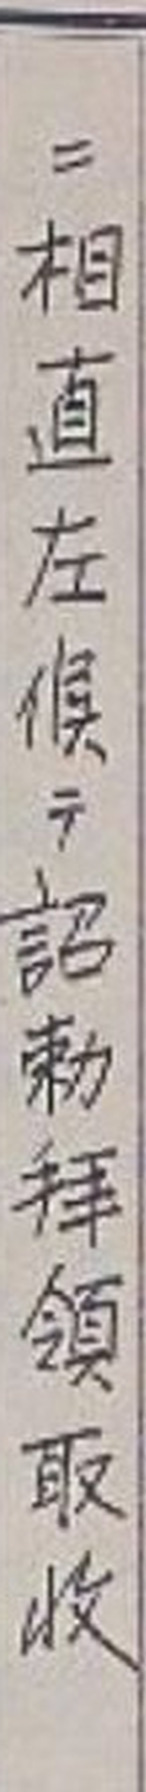に相直左候て詔勅拝領取収
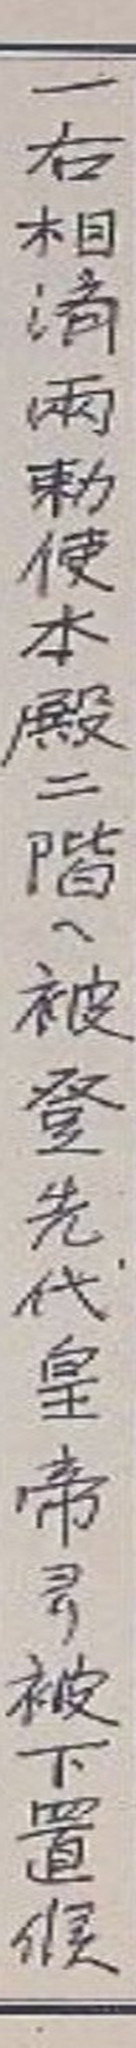一右相済両勅使本殿二階へ被登先代皇帝より被下置候
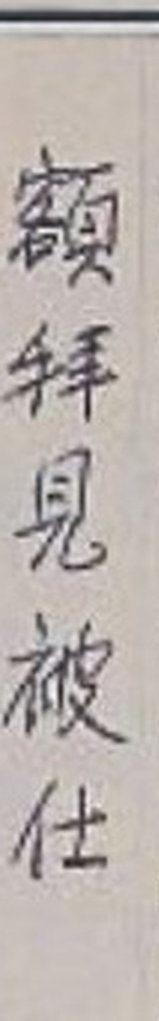額拝見被仕
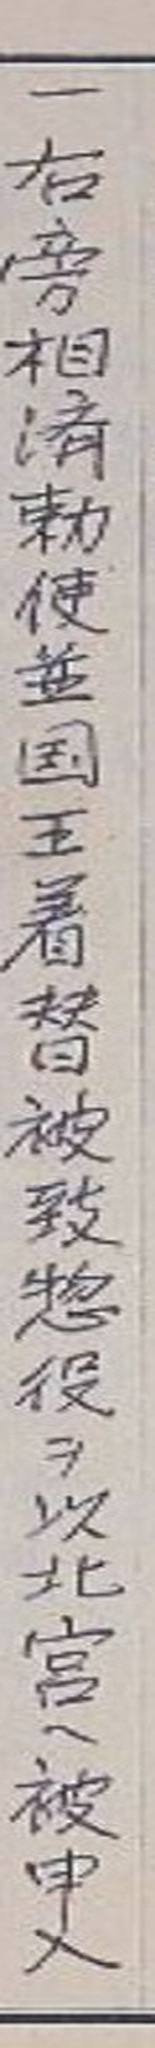一右旁相済勅使並国王着替被致惣役を以北宮へ被申入
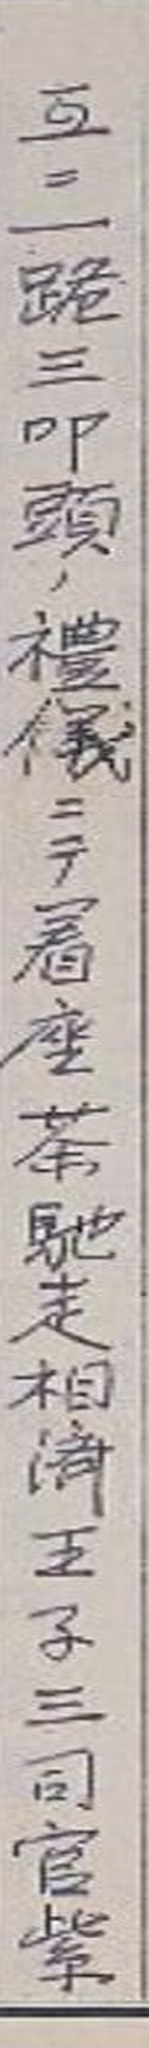互に一跪三叩頭の礼儀にて着座茶馳走相済王子三司官紫
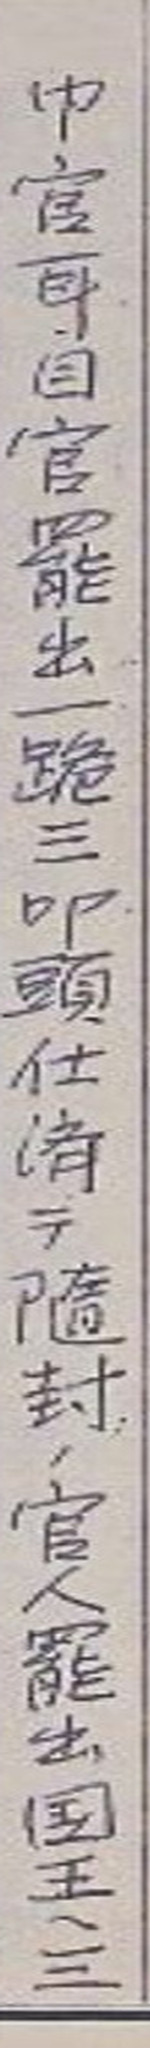巾官耳目官罷出一跪三叩頭仕済て随封の官人罷出国王へ三
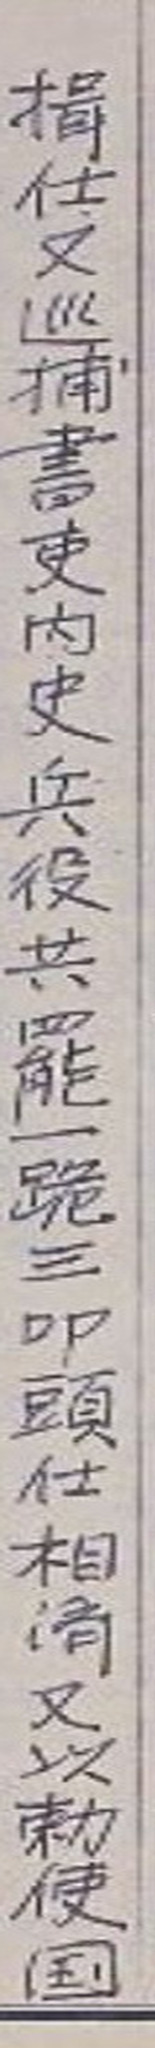楫付又巡捕書吏内史兵役共罷一跪三叩頭仕相済又以勅使国
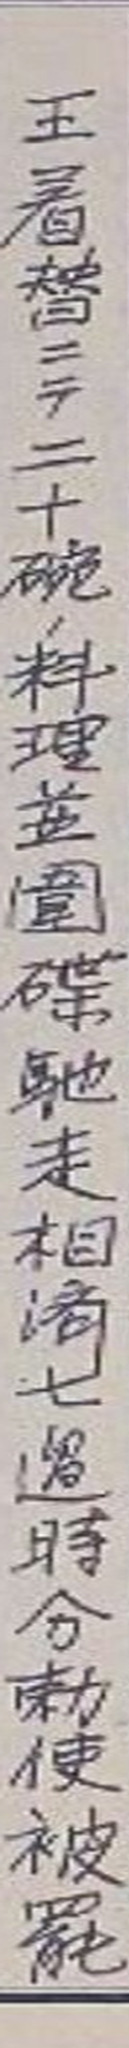王着替にて二十碗の料理並囲碟馳走相済七過時分勅使被罷
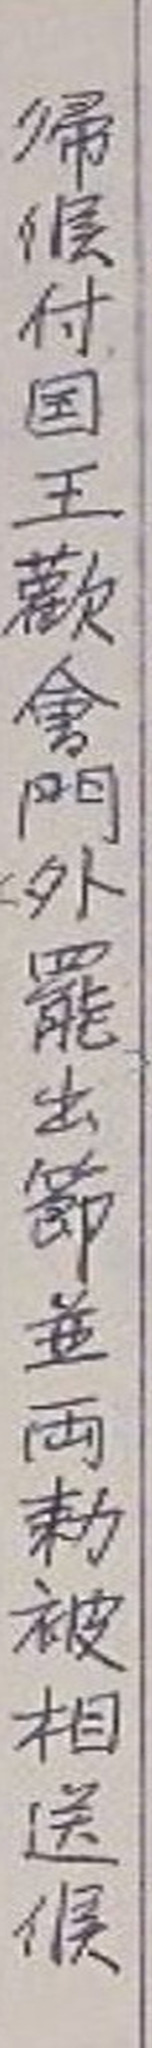帰候付国王歓会門外罷出節並両勅被相送候
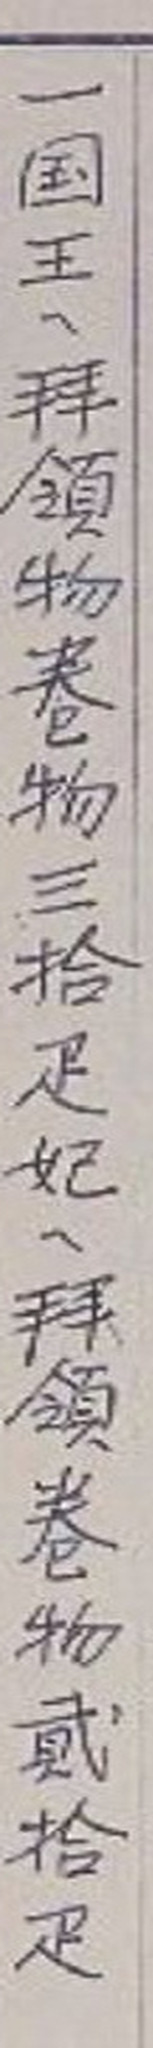一国王へ拝領物巻物三拾疋妃へ拝領巻物弐拾疋
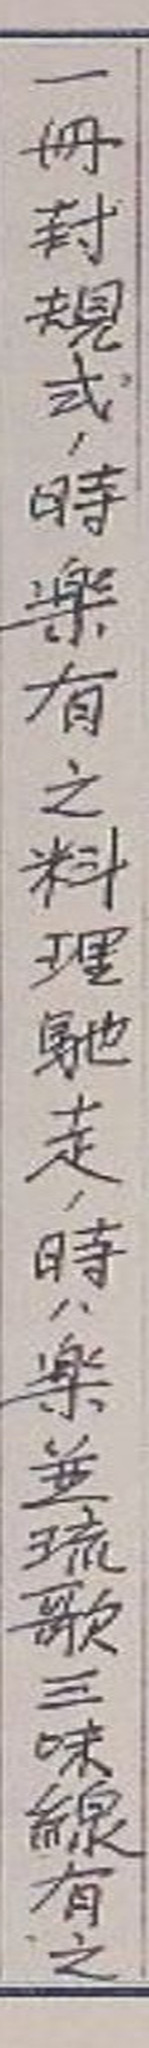一冊封規式の時楽有之料理馳走の時は楽並琉歌三味線有之

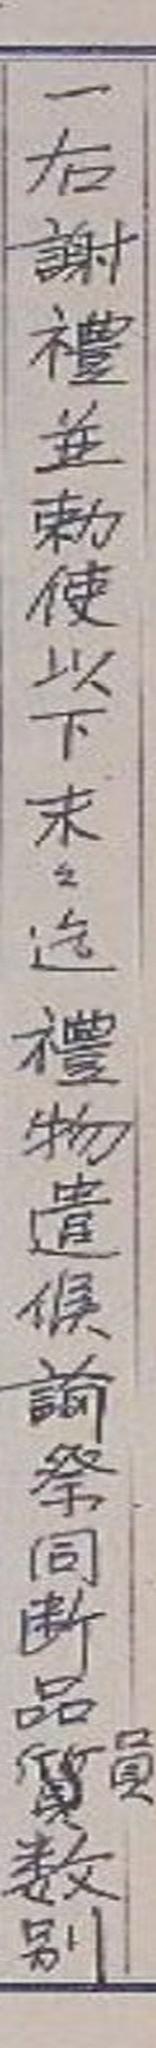一右謝礼並勅使以下末々迄礼物遣候諭祭同断品員数別
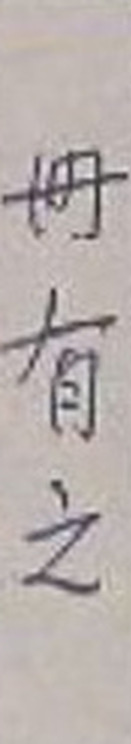冊有之
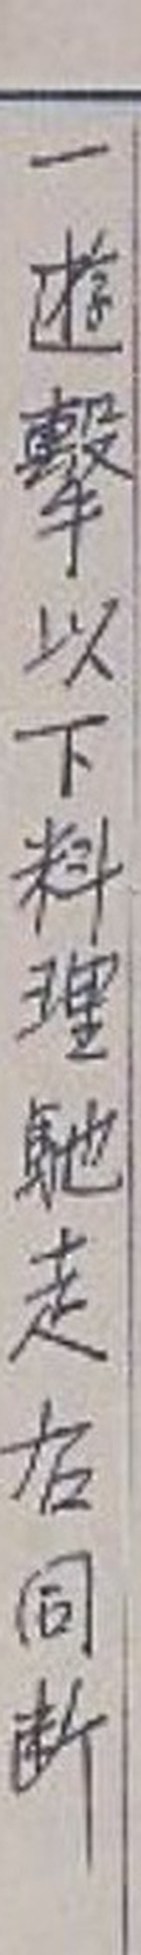一遊撃以下料理馳走右同断
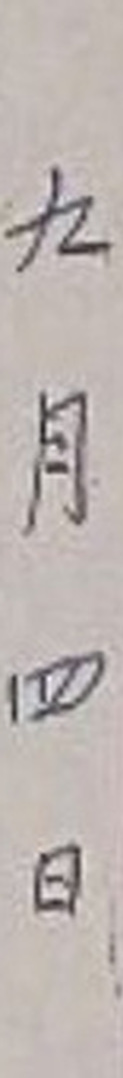九月四日
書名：支那冊封使来琉諸記 下巻
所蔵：University of the Ryukyus Library
